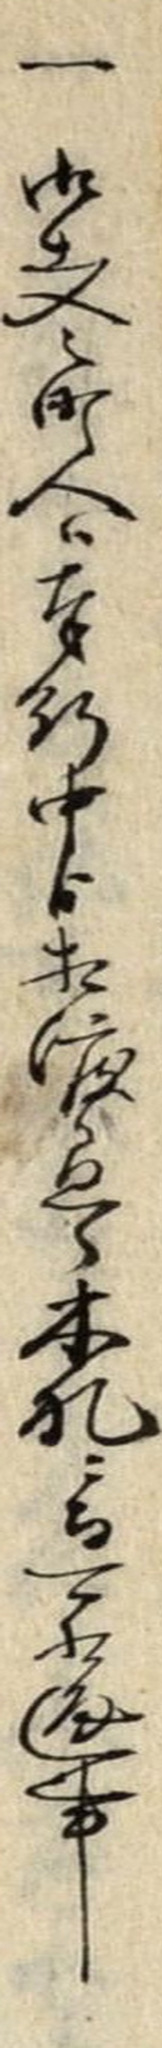一御出入之町人は奉行中ゟ相渡置候木札にて可相通事
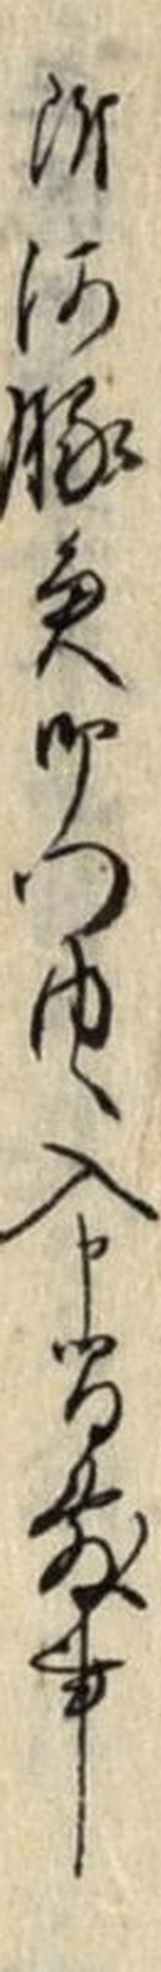附河豚魚御門内へ入申間敷事
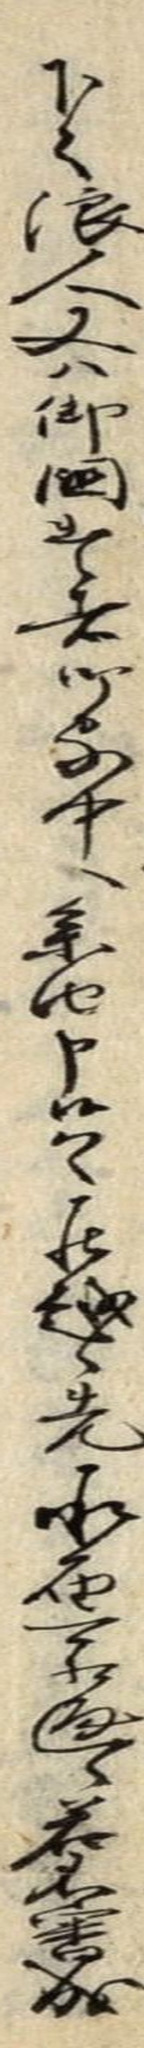一下々浪人又は御国出之者御家中へ参由申候はゝ罷越候先承届可相通候若不審成
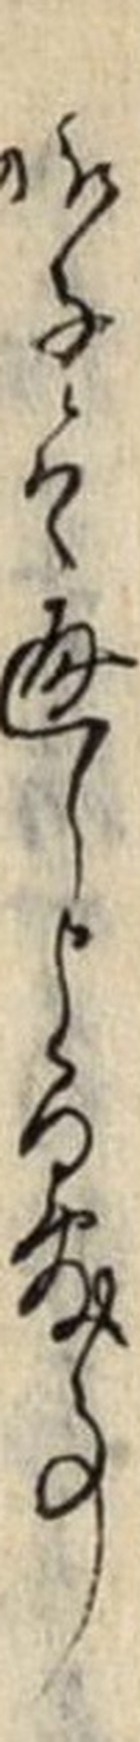様子に候はゝ通し申間敷事
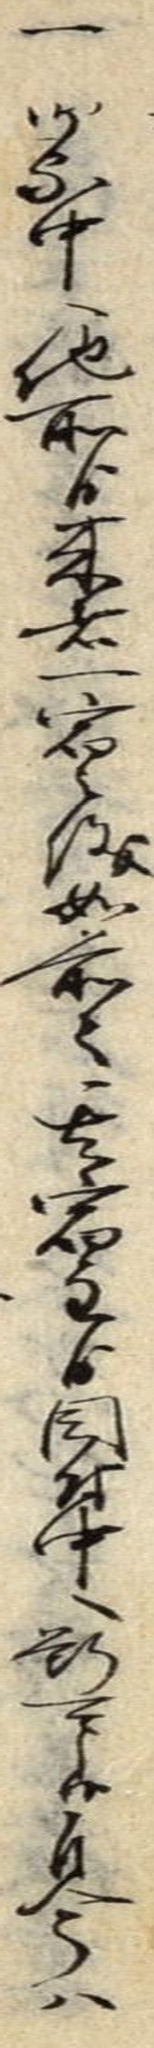一御家中へ他所ゟ来者一宿之儀如前々其宿主ゟ目付中へ断可申候自今は
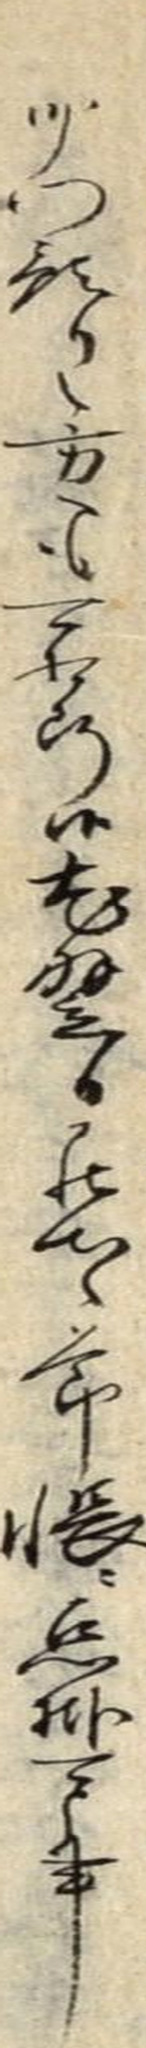御門預り之方へも可相断候尤翌日罷出候節帳に点掛可申事
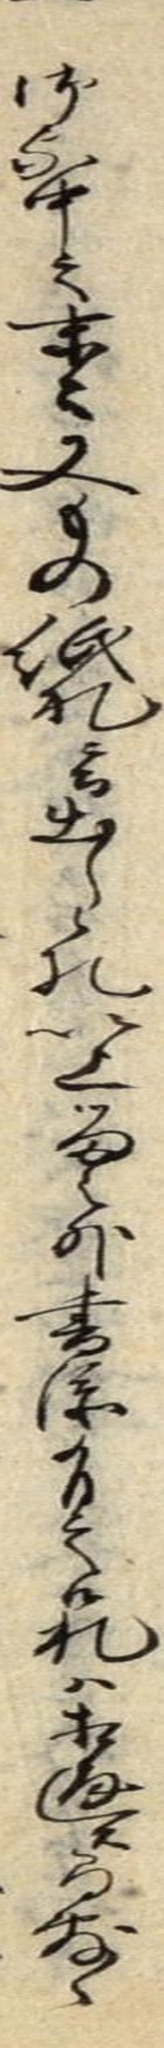一御家中之末々又もの紙札にて出し候札以上留之外書添有之候札は相通す間敷候
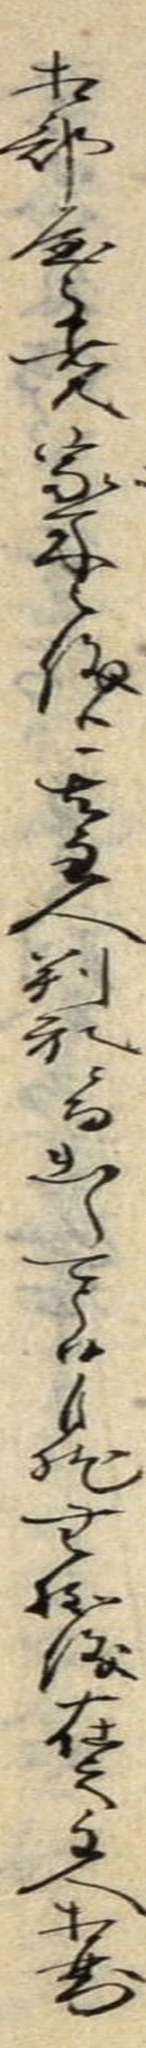相部屋之者共家来之儀は其主人判形にて出し可申候自然無據儀在之主人相対

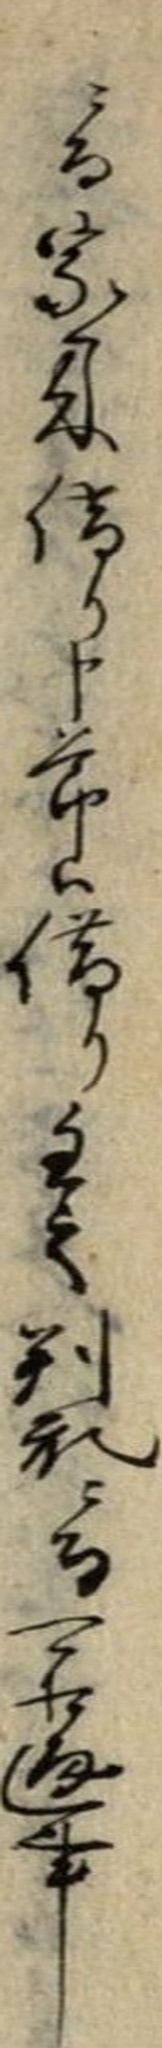にて家来借り申節は借り主之判形にて可相通事
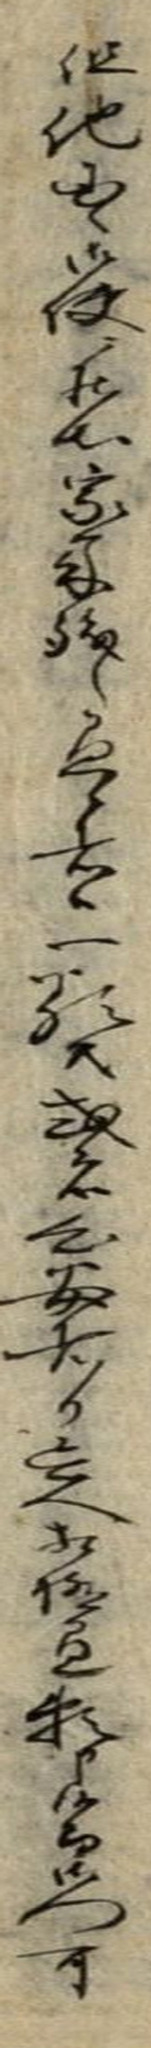但他国へ御使に罷出家来残し置候者は一類共或は心安者ゟ壱人相極置頼申候て御門可
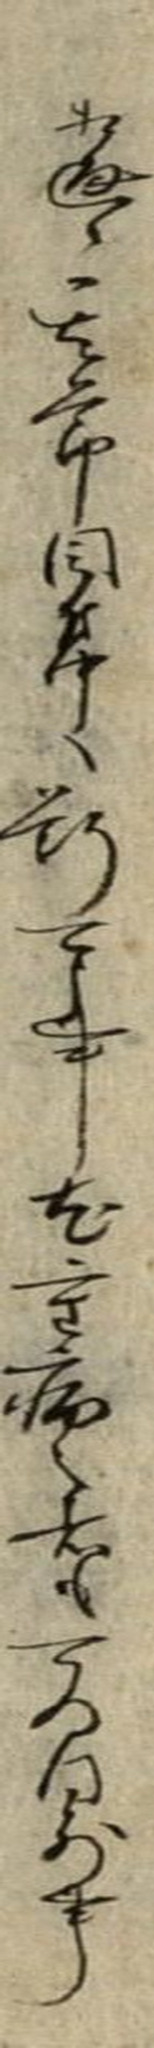相通候其節目付中へ断可申事尤重病之者も可為同前事
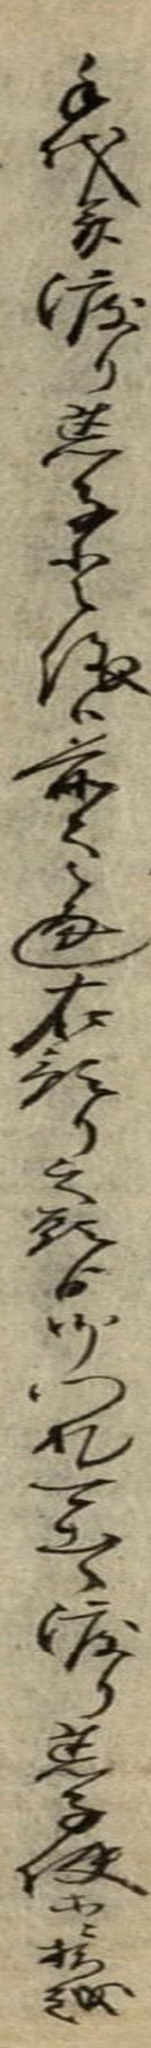一手代幷渡り荒子等之儀は前々之通右預り之頭ゟ御門札可出候渡り荒子使等に指越
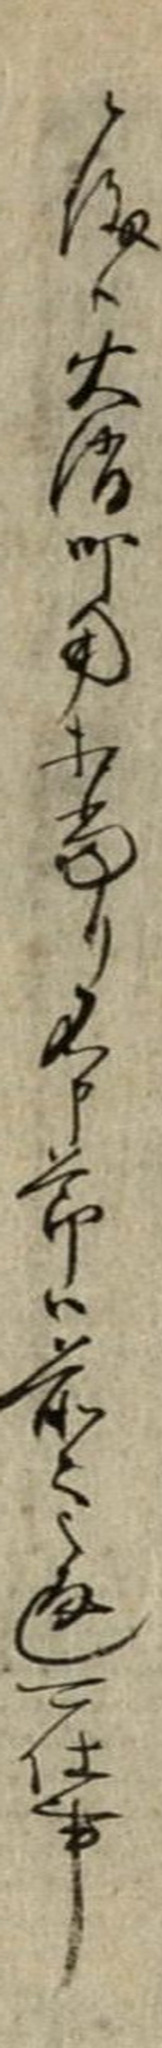候儀は火消御用相当り不申節は前々之通可仕事
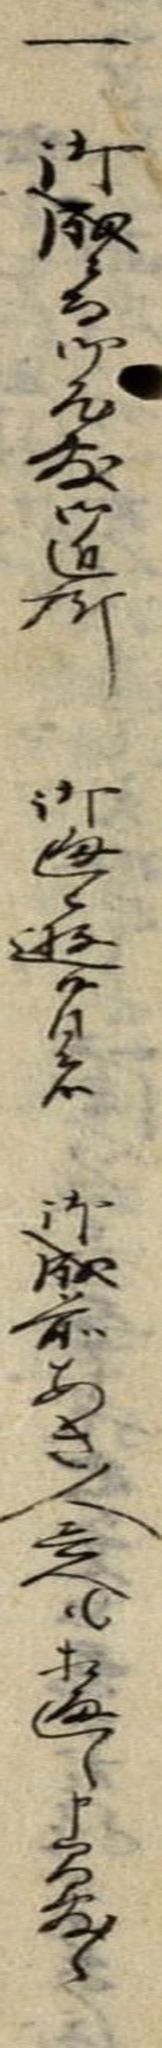一御成にて御屋敷御近所御通被遊候日は御成前あき人壱人も相通し申間敷候
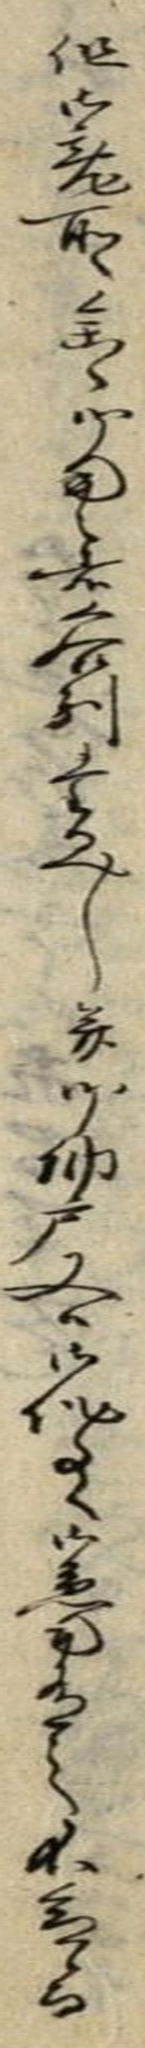但御台所へ参候御用之者各別たるへし幷御納戸又は御作事へ御急用有之不参候て
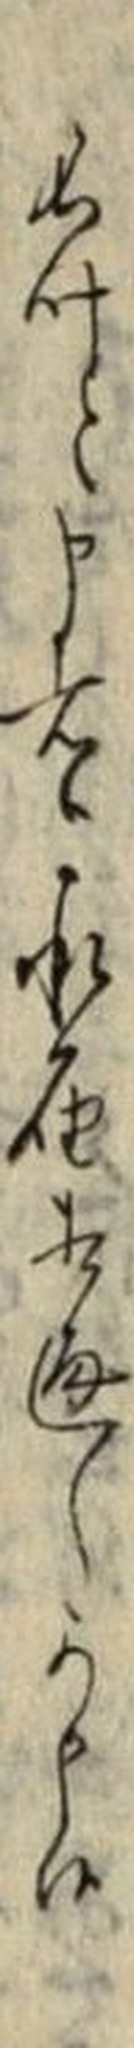不叶と申者は承届相通し可申候
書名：三都并道中之部
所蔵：福井県文書館 Fukui Prefectural Archives
